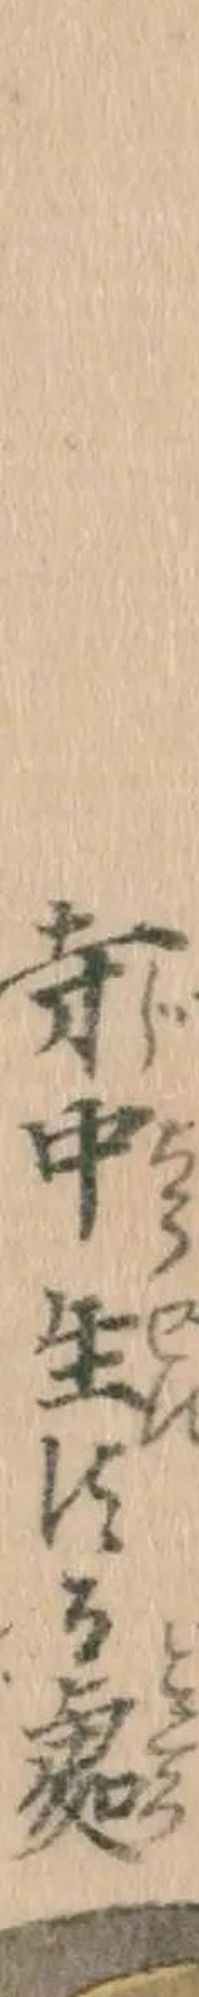寺中生する処
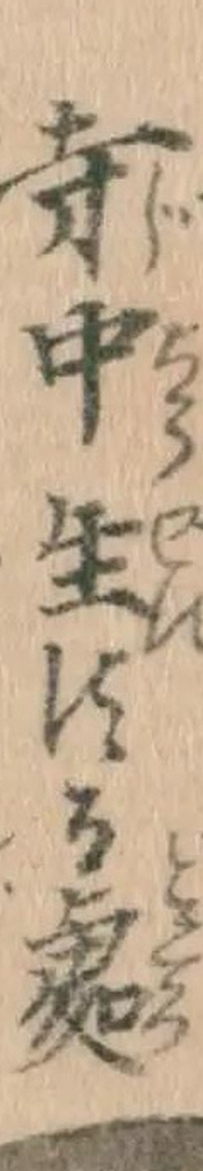寺中生する処
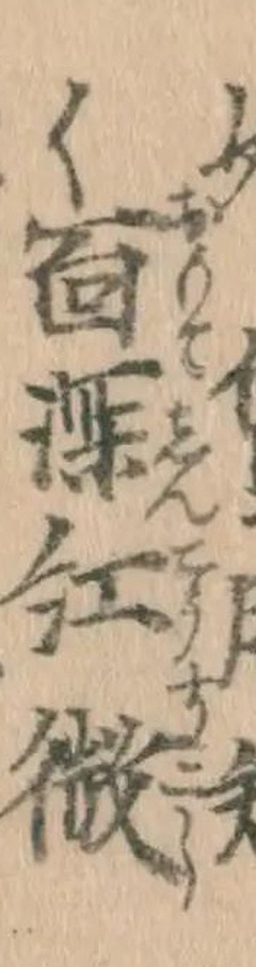く面深紅微
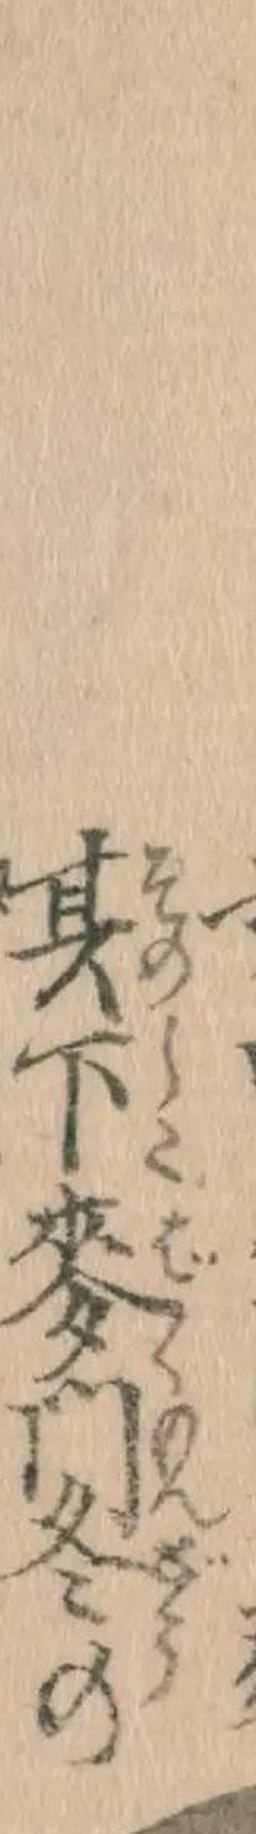其下麦門冬の
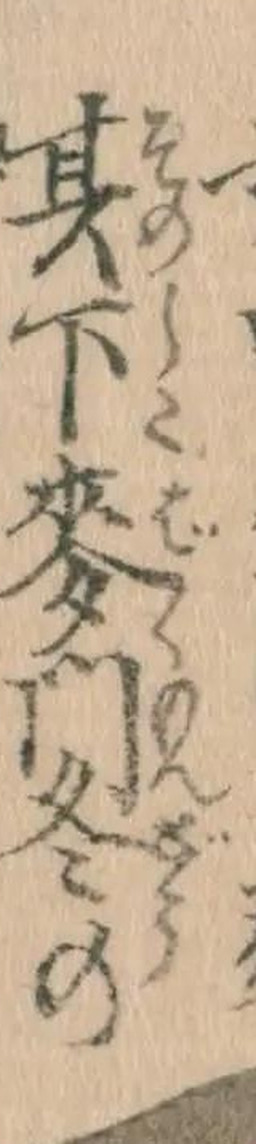其下麦門冬の
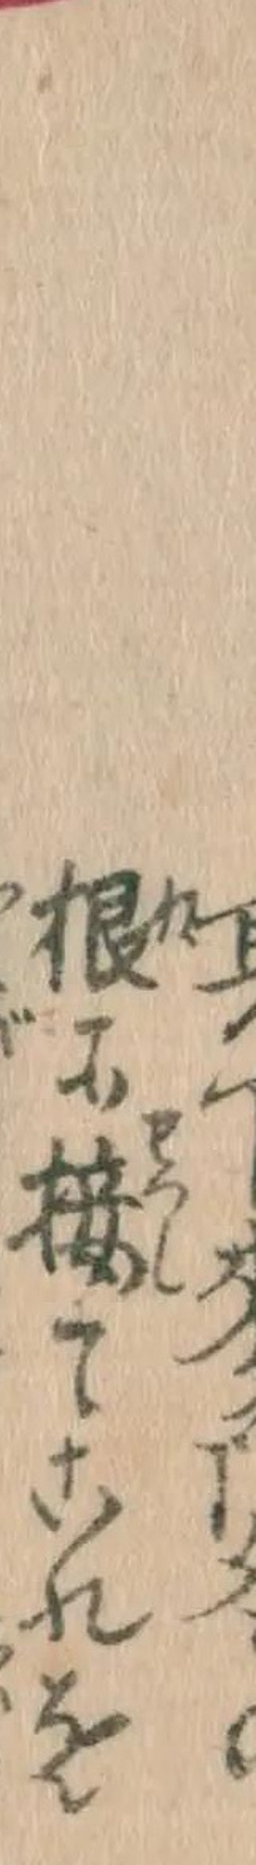根に接てこれを
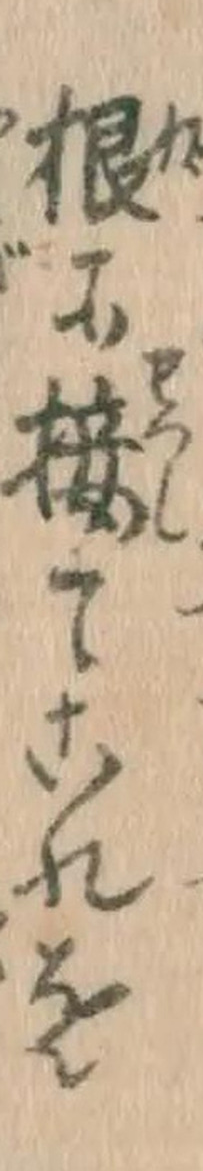根に接てこれを
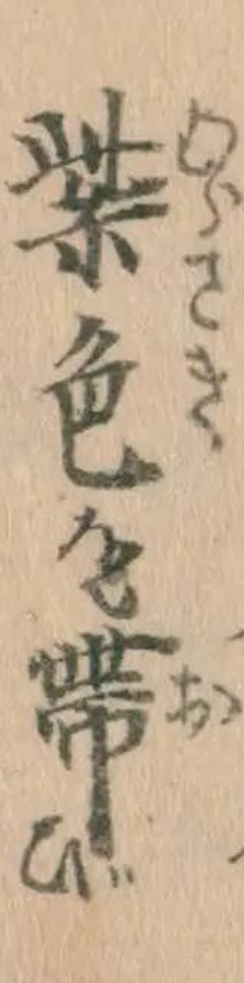紫色を帯び
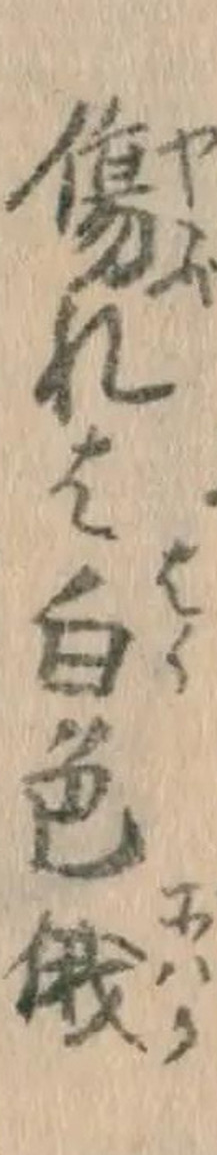傷れは白色俄
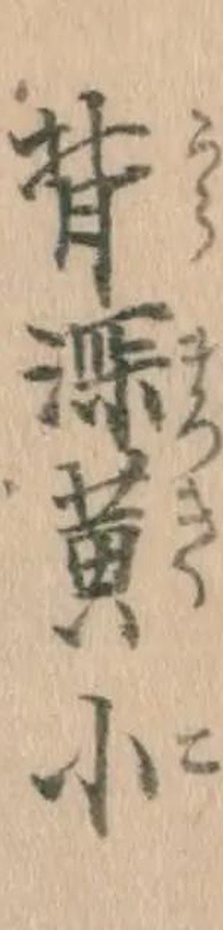背深黄小
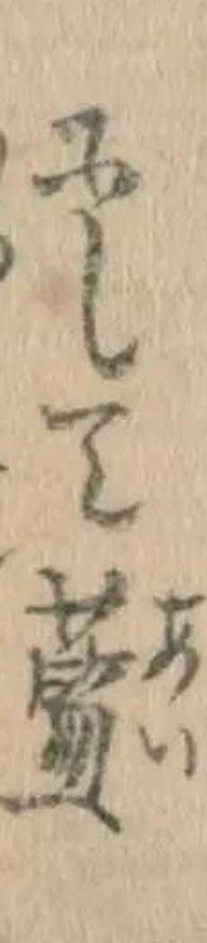にして藍
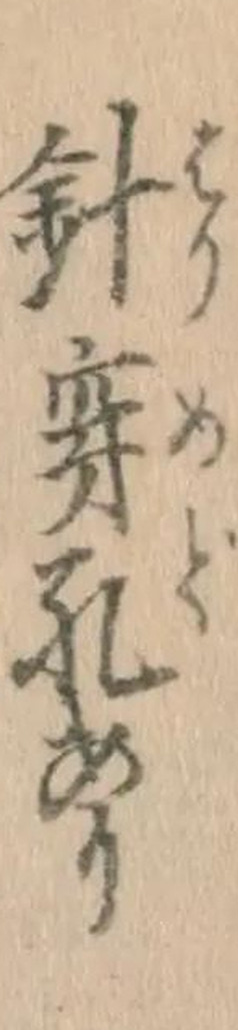針穿孔あり
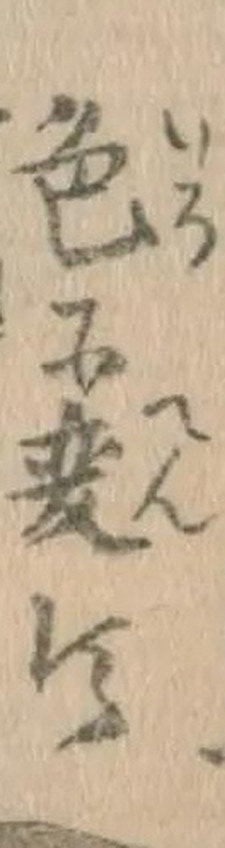色に変す
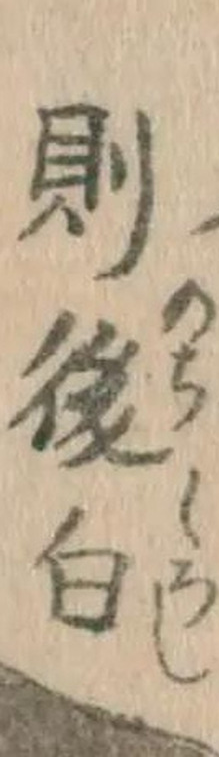則後白
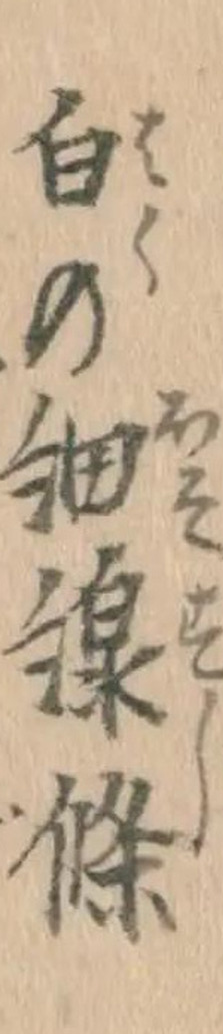白の細線条
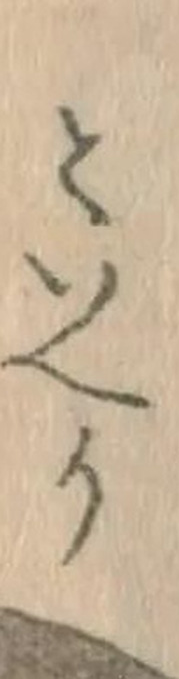といへり
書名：本草図譜. 巻58-60
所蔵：国立国会図書館 National Diet Library, JAPAN
